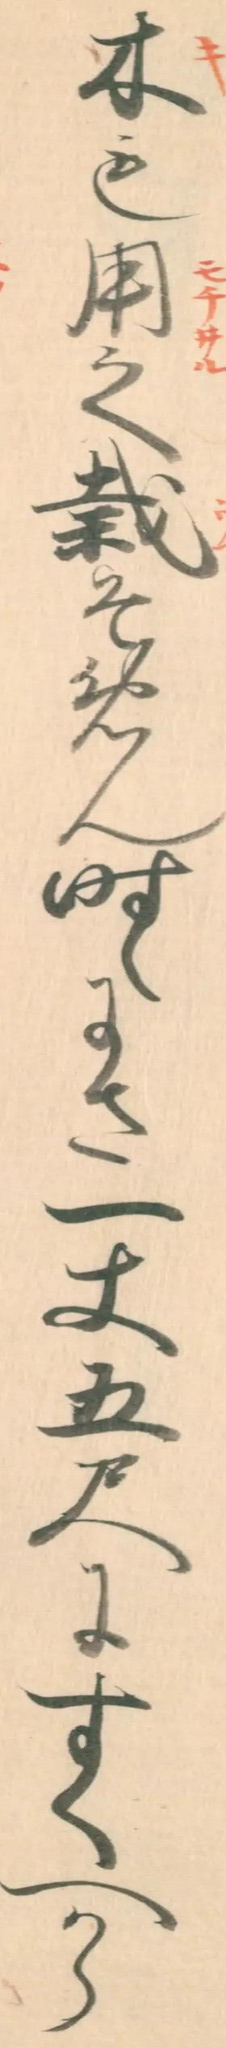木も用之栽そめん時々にさ一丈五尺にすくへから
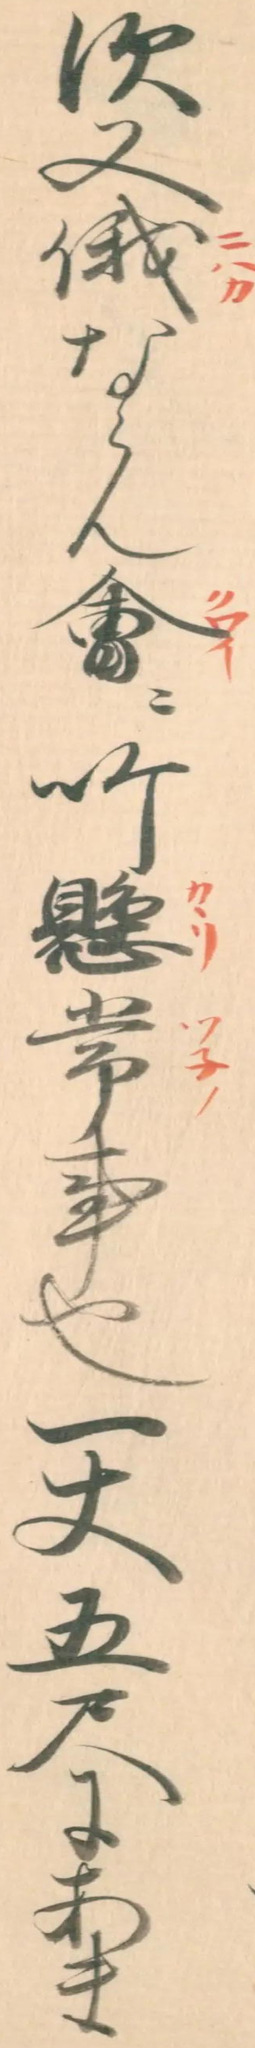す又俄ならん會に竹懸常事也一丈五尺にあま
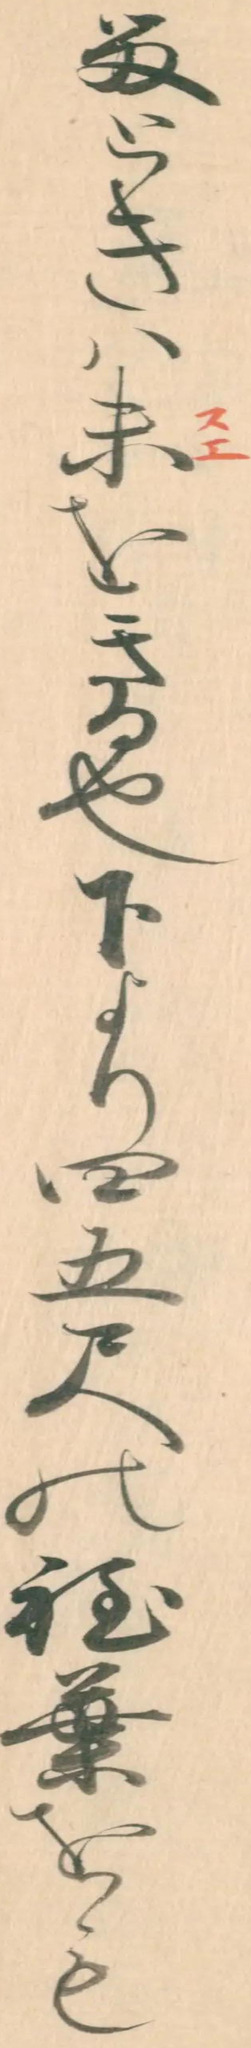るときは末をきる也下より四五尺の程葉をも
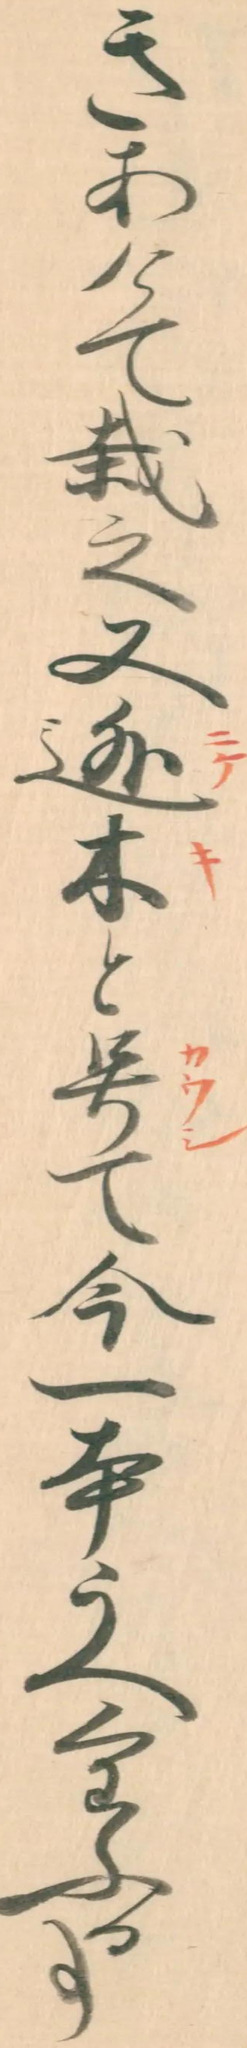きあけて栽之逃木と号て今一本うへくわふる事
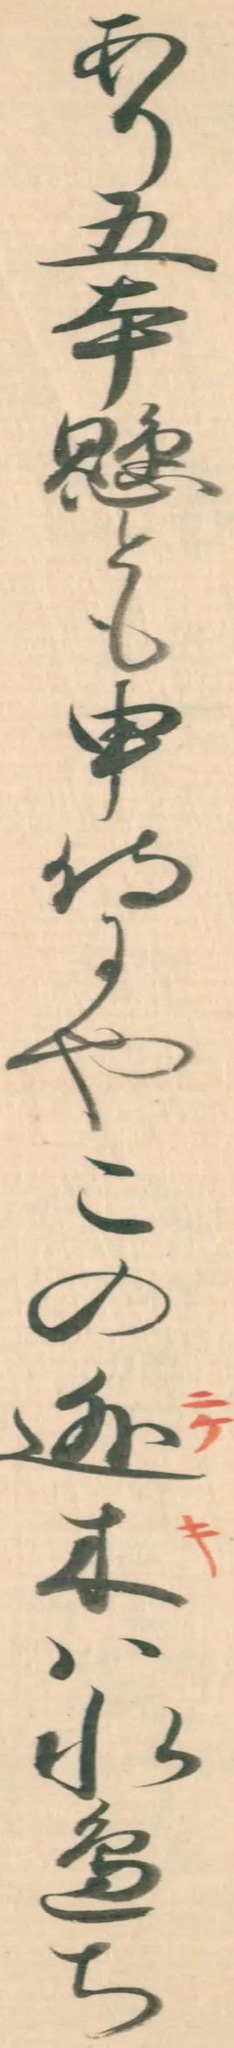あり五年懸とも申侍にやこの逃木は水辺ち
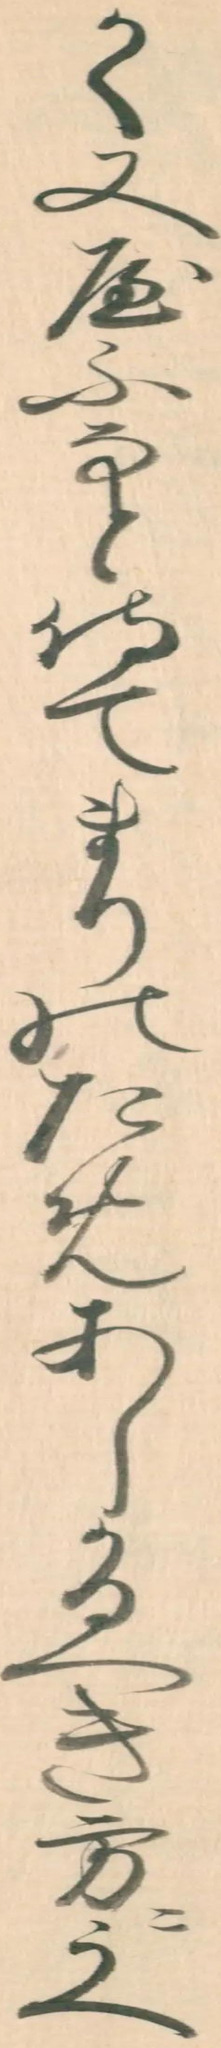かく又やふなと侍てまりのためあしかるへき方にうへ
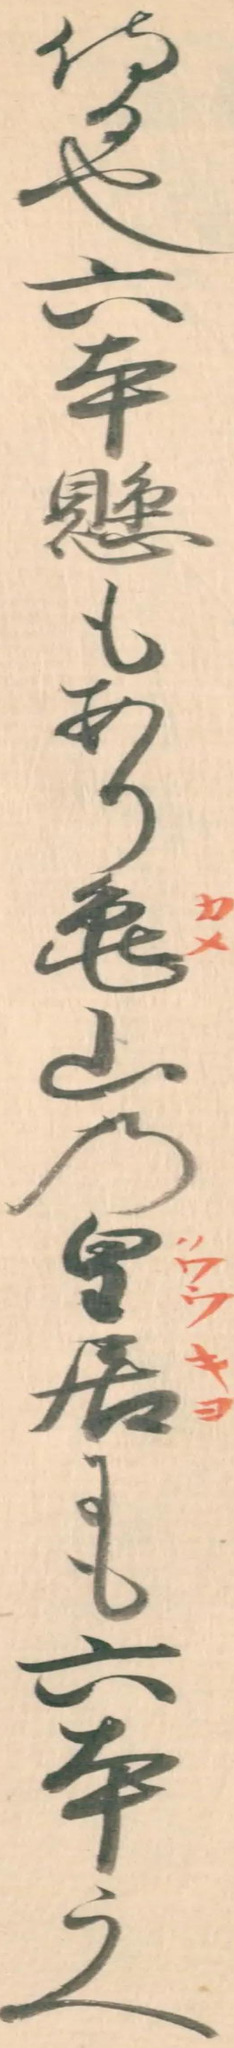侍る也六本懸もあり亀山の皇居にも六本うへ
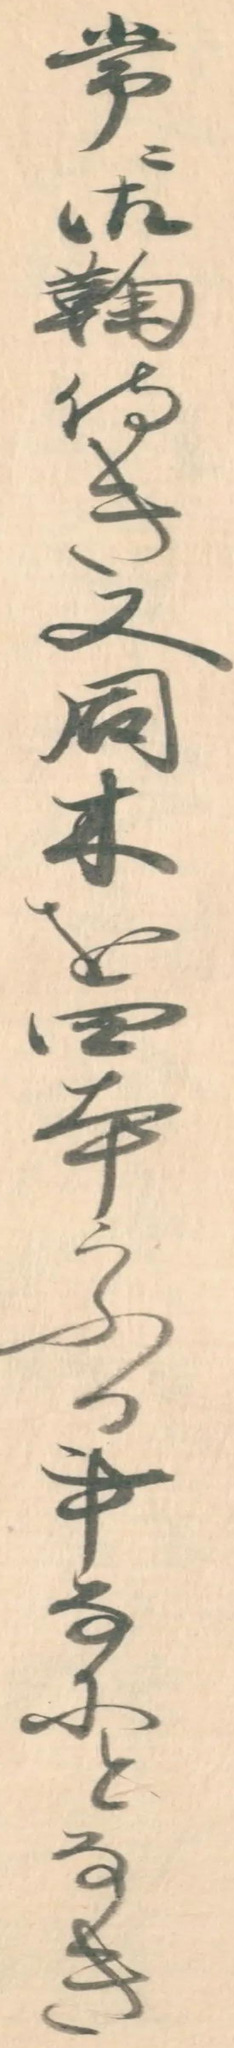常に御鞠侍き又同木を四本うふる事なにとなき
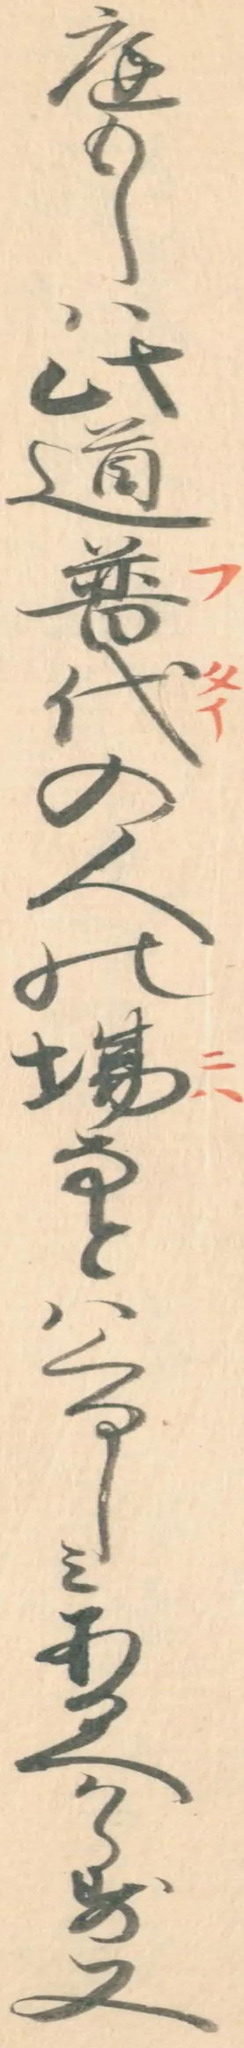庭もしは此道普代の人の場なとはくるしみあるへからす又

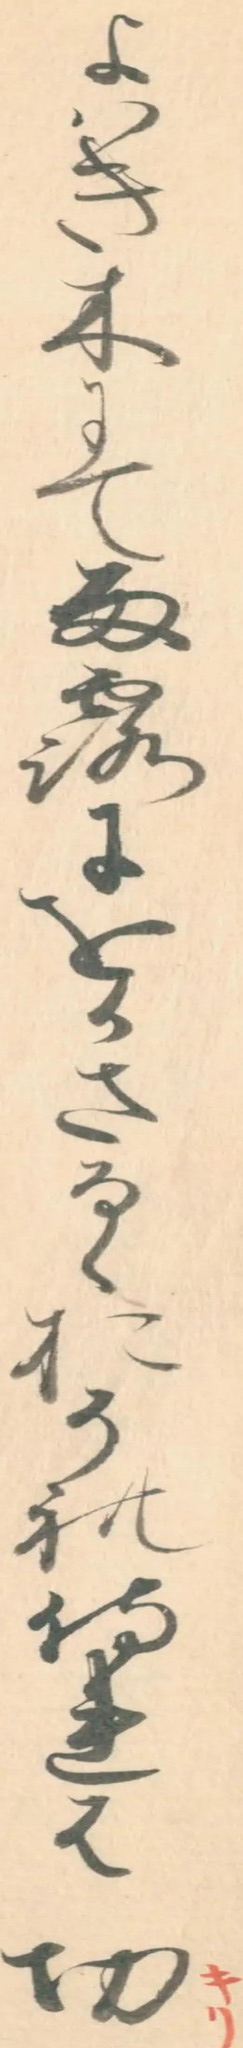よはき木にて雨露にをかさるゝおそれ侍れは切
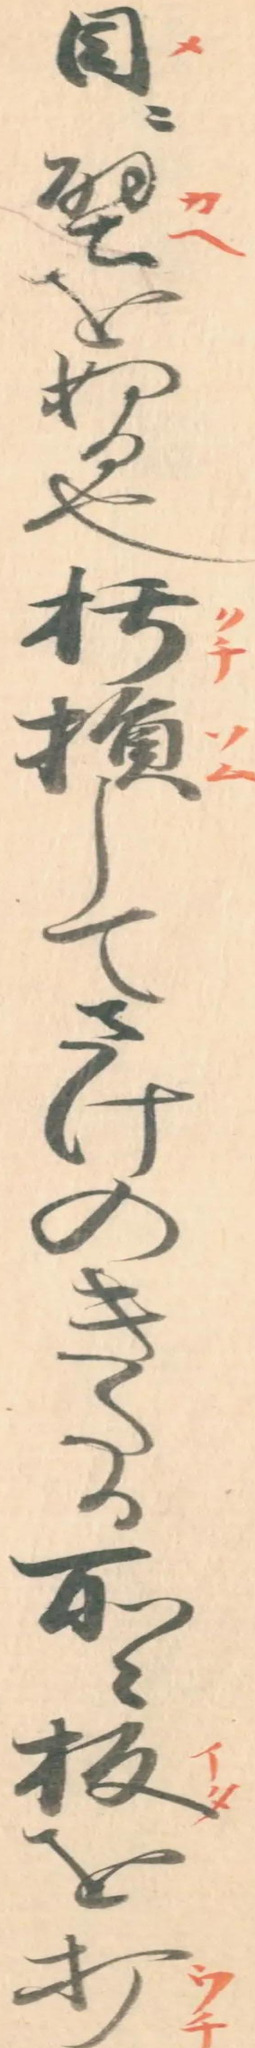目に壁をぬる也朽損してさけのきたる所々板を打
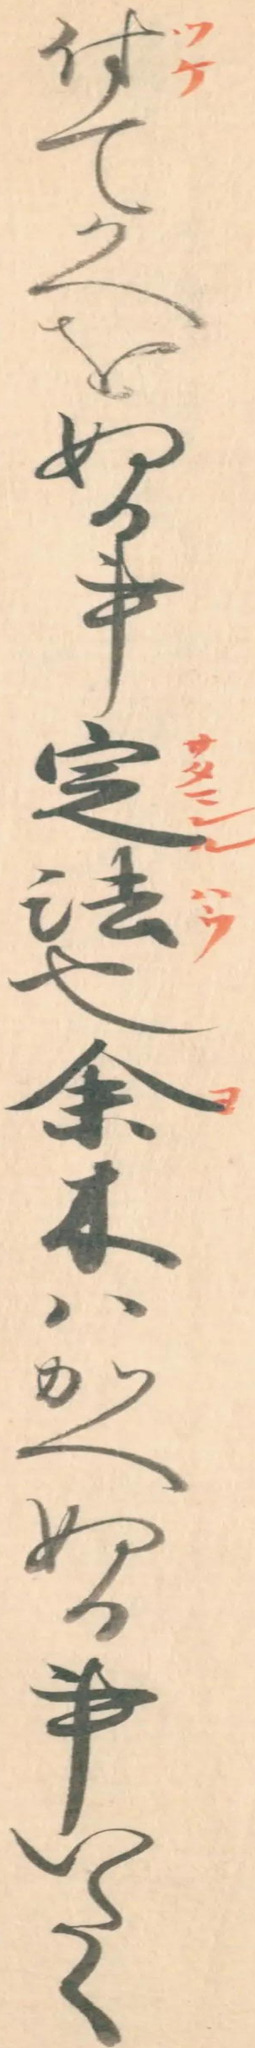付てかへをぬる事定法也余木はかへぬる事いたく
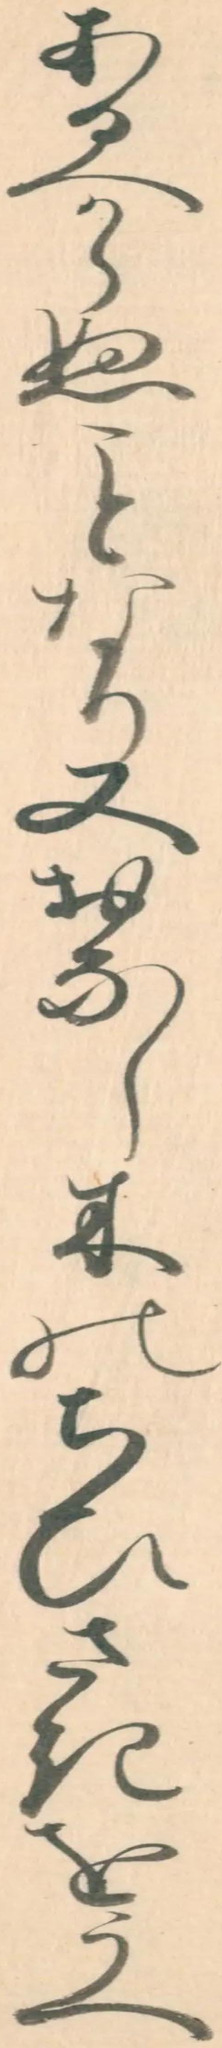あるへからぬことなり又おなし木のちひさきをうへ
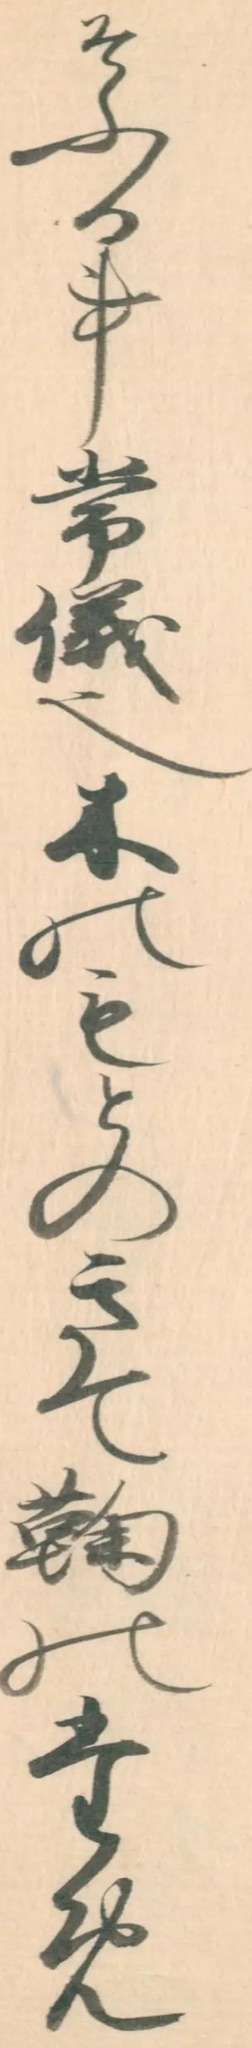そふる事常儀也木のもとのきて鞠のため
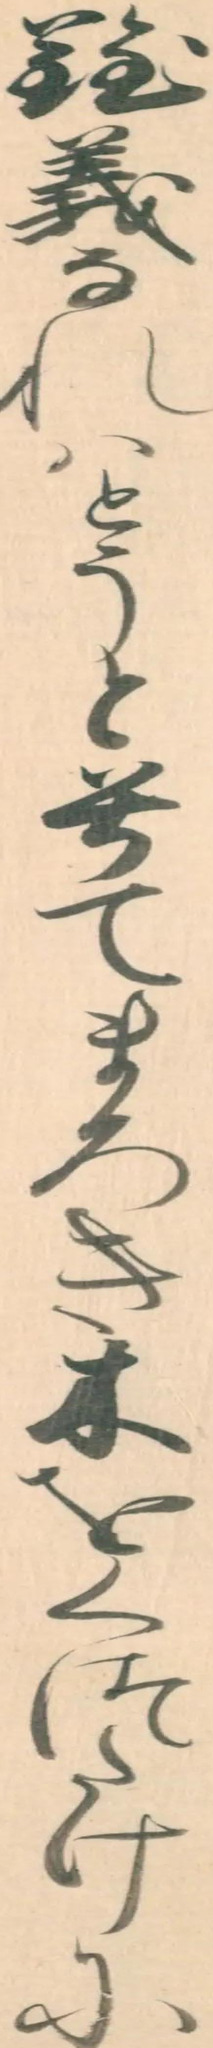難義なれはとうと号てまろき木をくつたけに
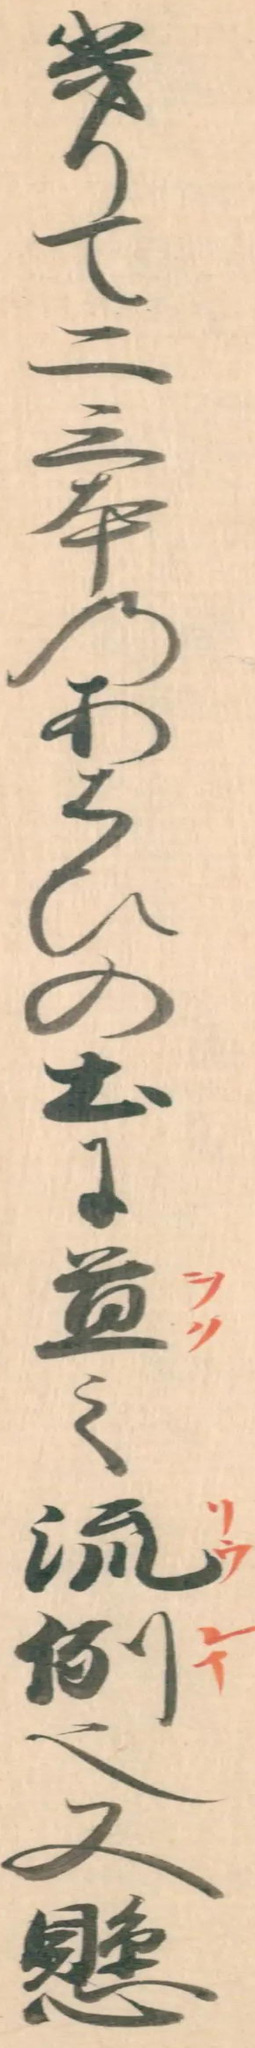きりて二三本のあはひの土に置之流例也又懸
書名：遊庭秘抄 2巻. [1]
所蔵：国立国会図書館 National Diet Library, JAPAN
